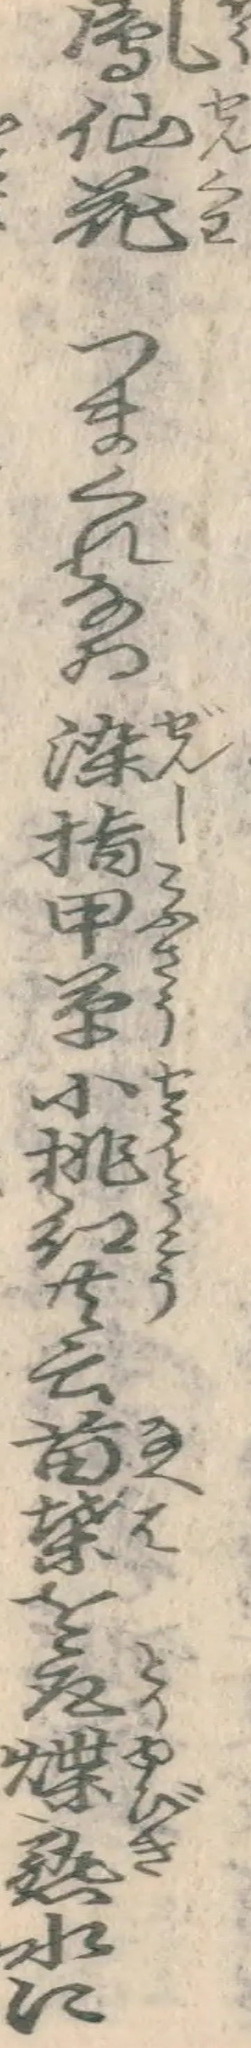鳳仙花つまくれなゐ染指甲草小桃紅共云苗葉を取煠熟水に
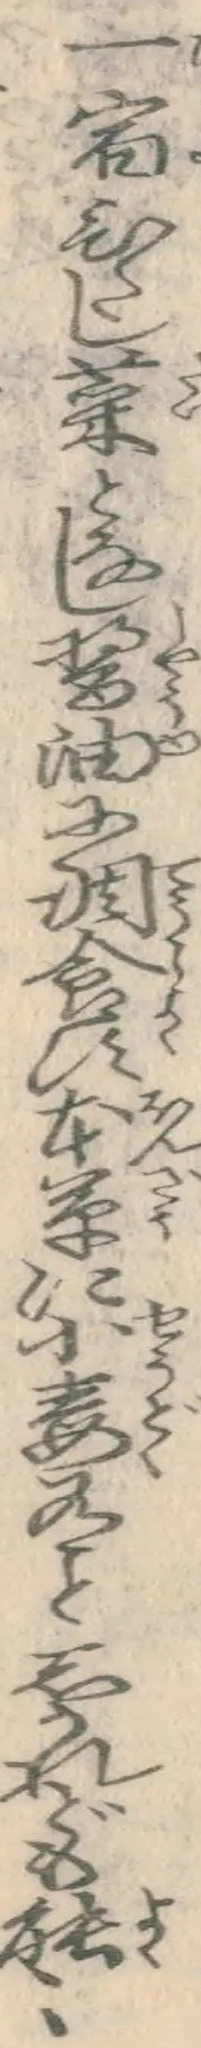一宿ひたし菜となし醤油に調食す本草に小毒有ことしかれども能々
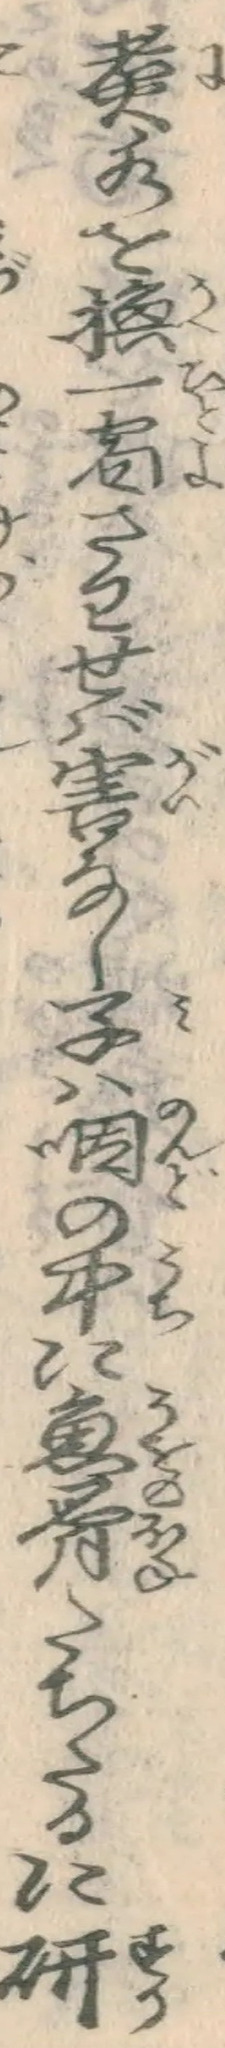煑水を換一宿さわせば害なし子は咽の中に魚骨たちたるに研
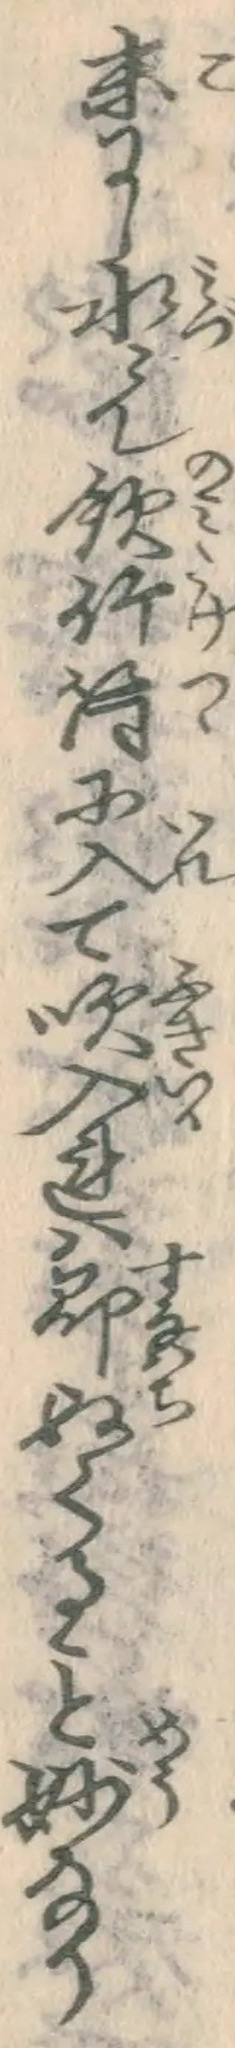末にし水にて飲竹筒に入て吹入れは即ぬくること妙なり
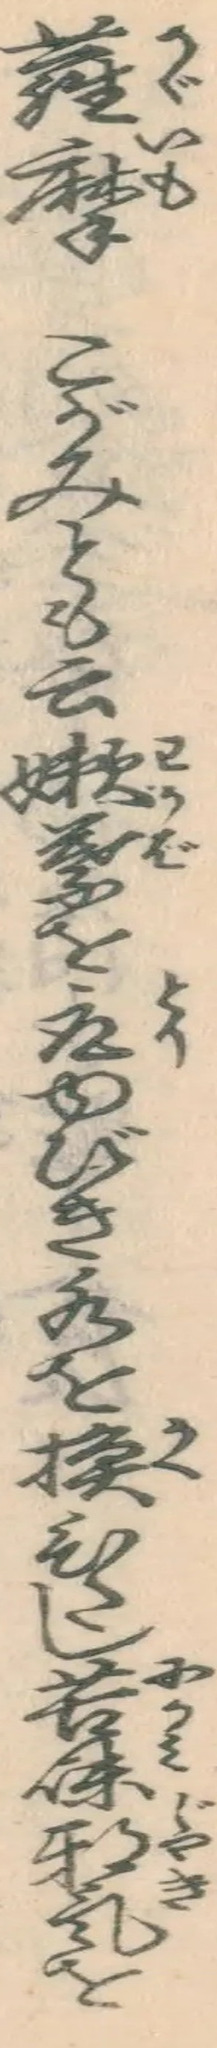蘿摩こがみとも云嫰葉を取ゆびき水を換ひたし苦味邪気を
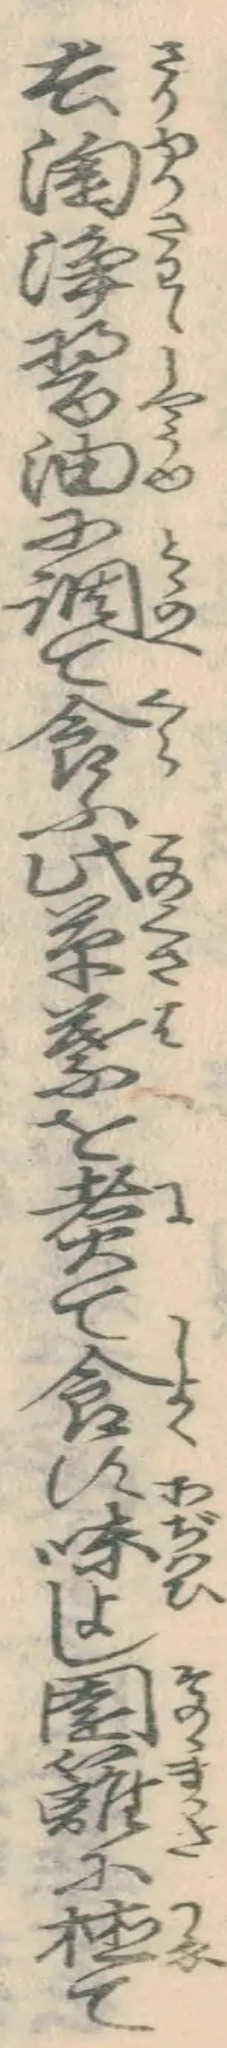去淘浄醤油に調て食ふ此草葉を煑て食す味よし園籬に植て
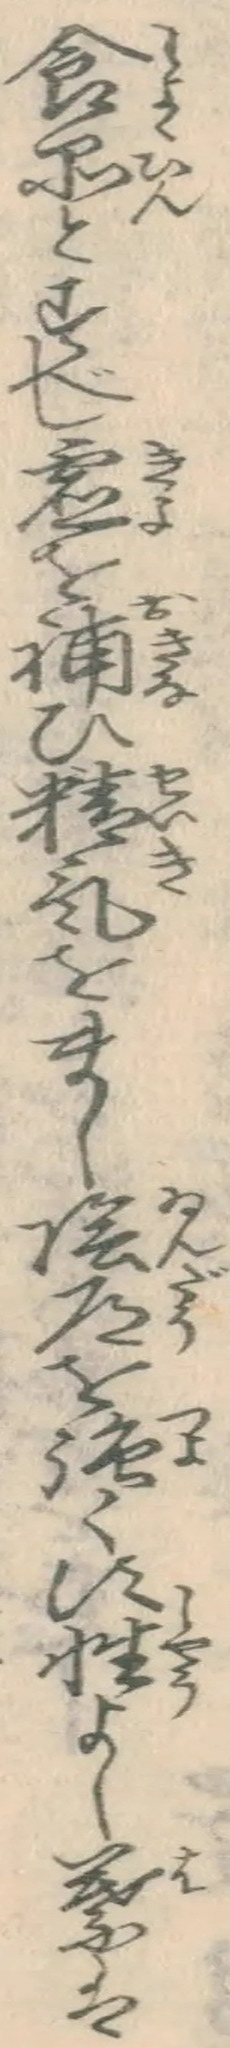食品とすべし虚を補ひ精気をまし陰道を強くす性よし葉は
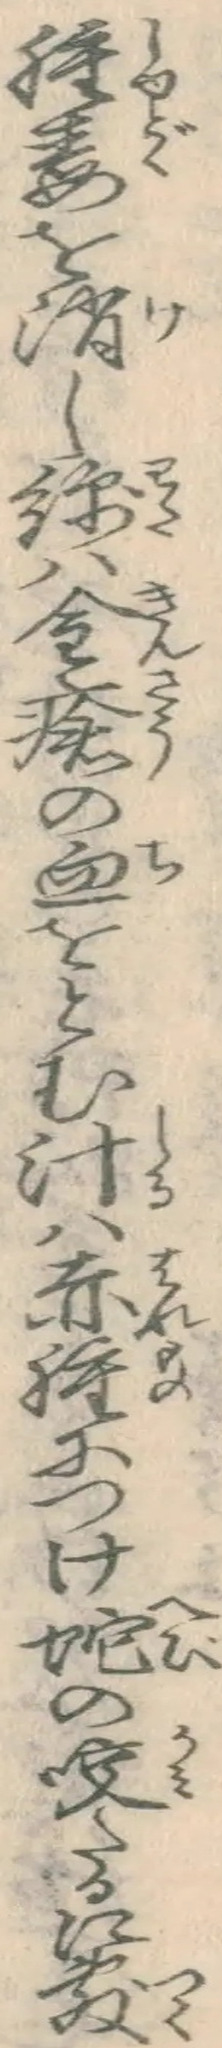種毒を消し綿は金瘡の血をとむ汁は赤腫につけ蛇の咬たるに敷
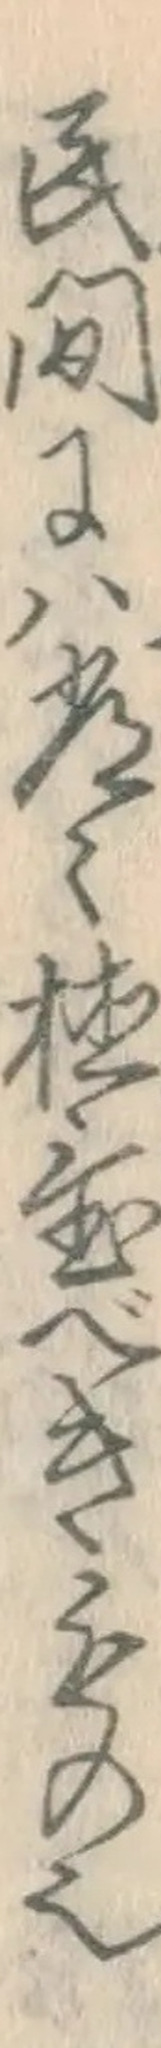民間には常々植置べきもの也
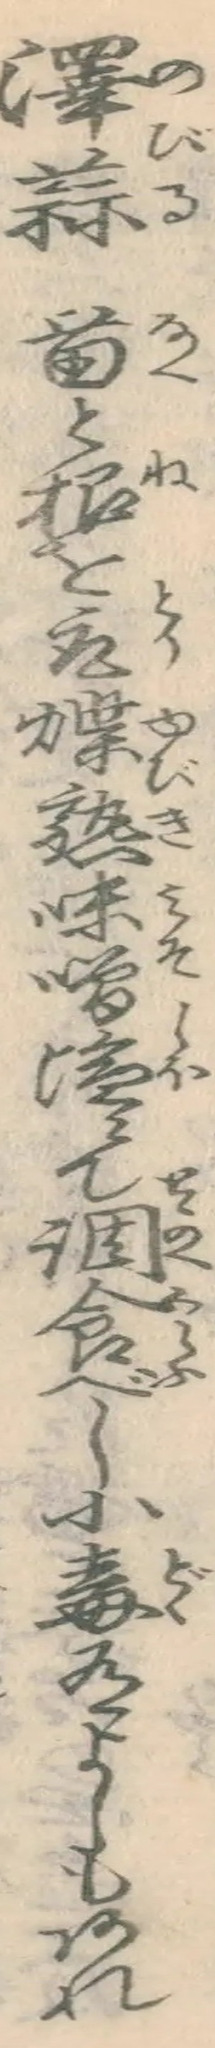澤蒜苗と根を取煠熟味噌塩にて調食べし小毒有よしもあれ
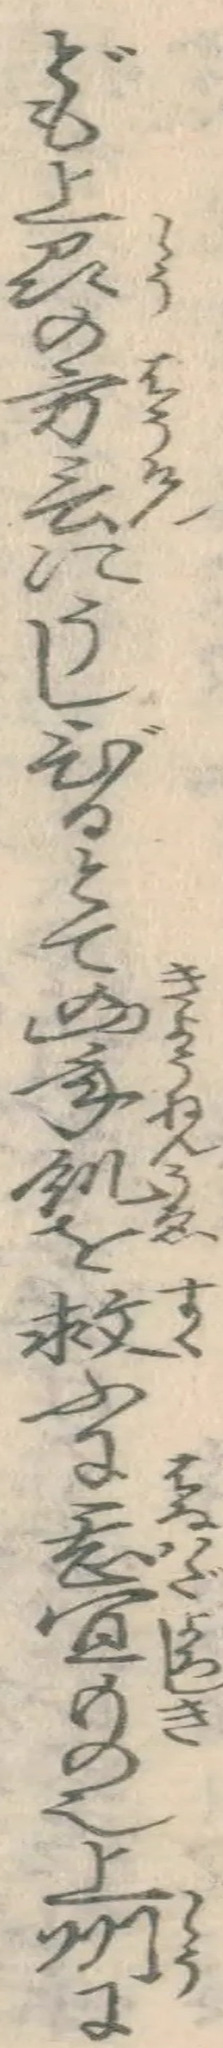ども上州の方言にうしびるとて凶年飢を救ふに甚宜もの也上州に
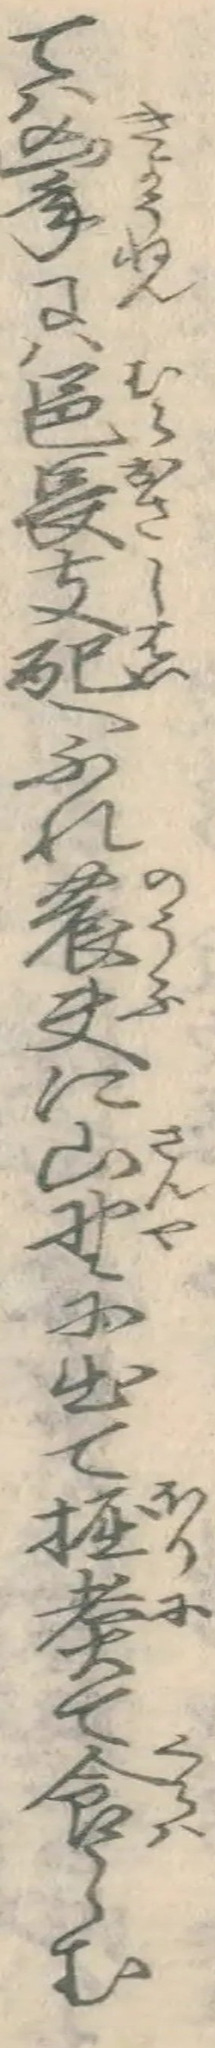ては凶年には邑長支配へふれ農夫に山野に出て堀煑て食しむ
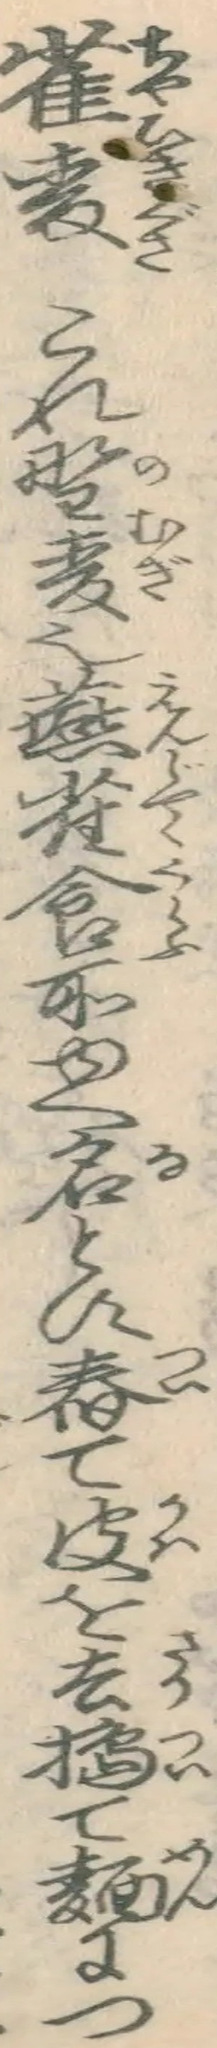雀麦これ野麦也燕雀食所ゆへ名とす舂て皮を去搗て麺につ
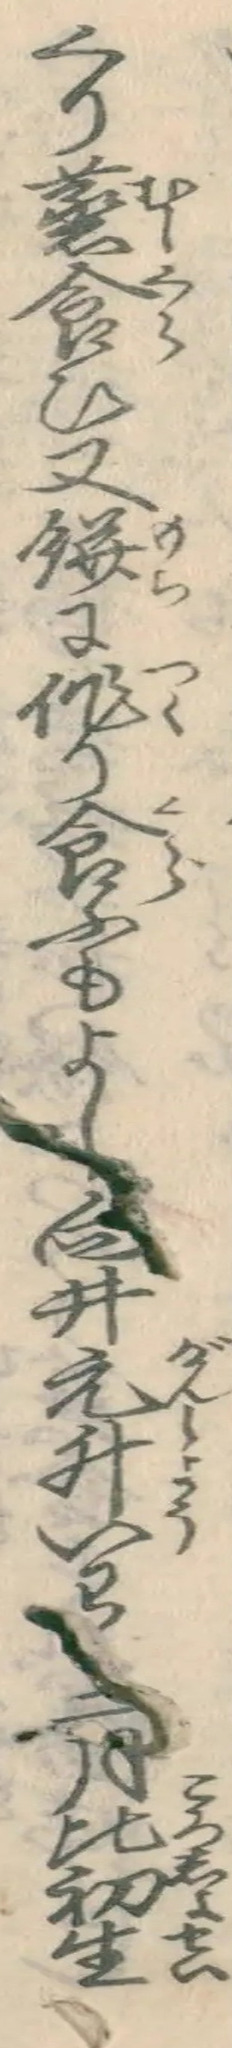くり蒸食ひ又餅に作り食ふもよし向井元升いわく二月比初生

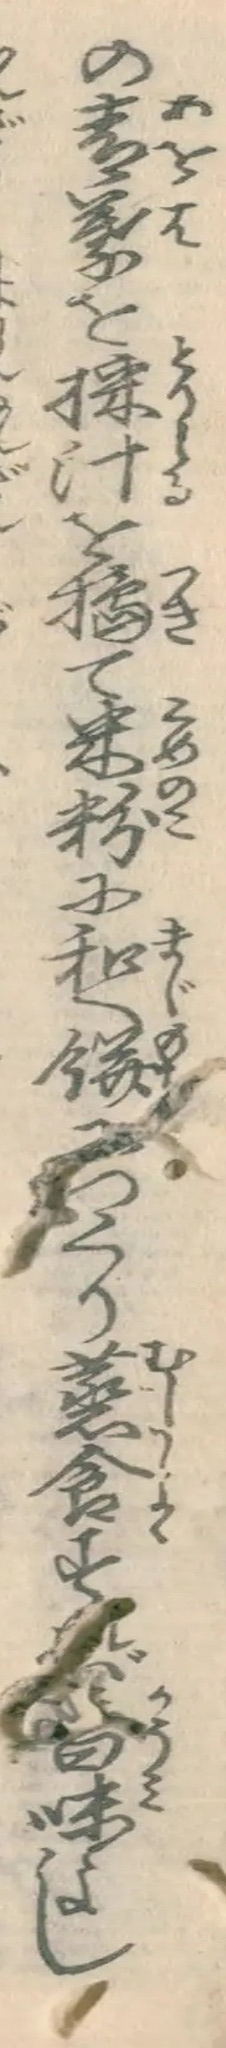の青葉を採汁を搗て米粉に和へ餅につくり蒸食すれば香味よし
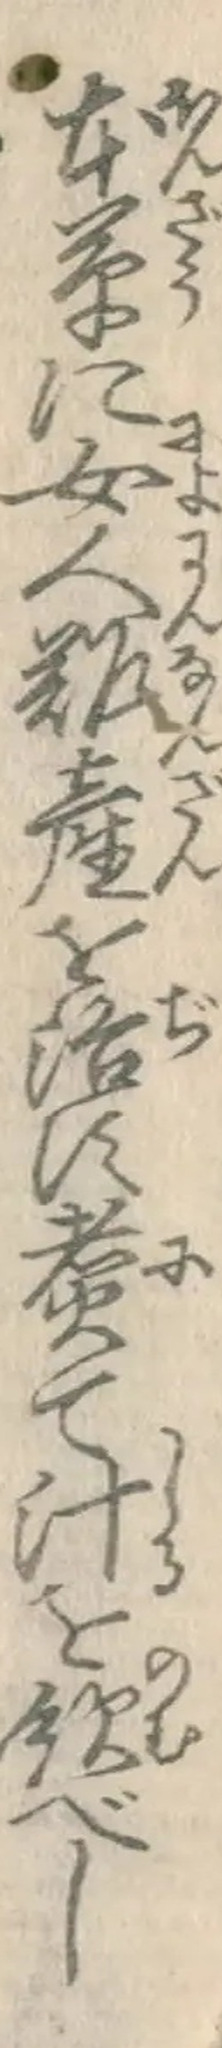本草に女人難産を治す煑て汁をの飲べし
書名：経済をしへ草
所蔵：国立国会図書館 National Diet Library, JAPAN
